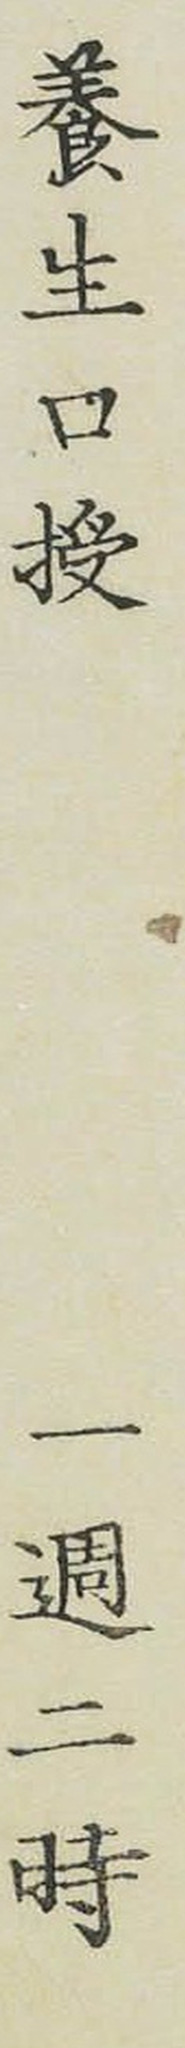養生口授一週二時

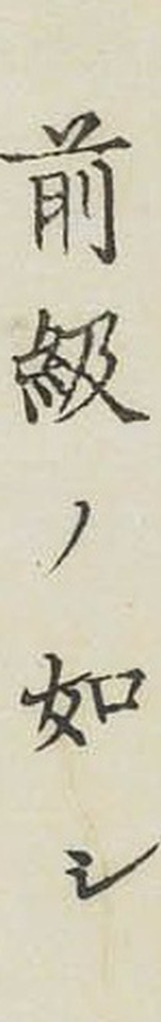前級ノ如シ
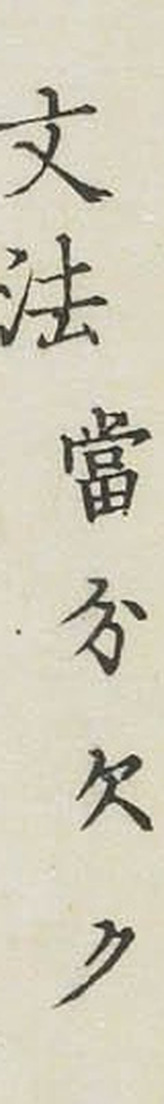文法当分欠ク
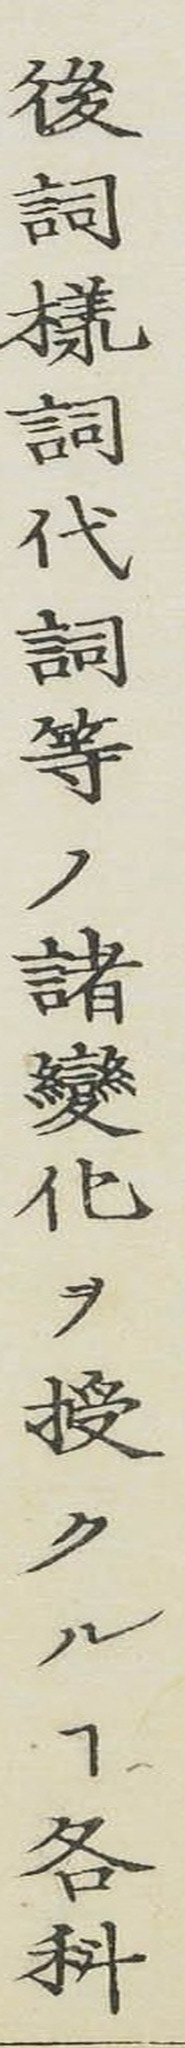後詞様詞代詞等ノ諸変化ヲ授クル事各科
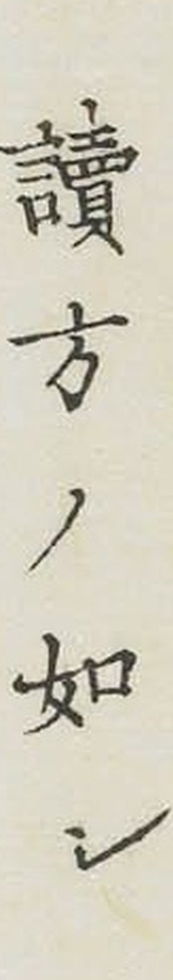読方ノ如シ
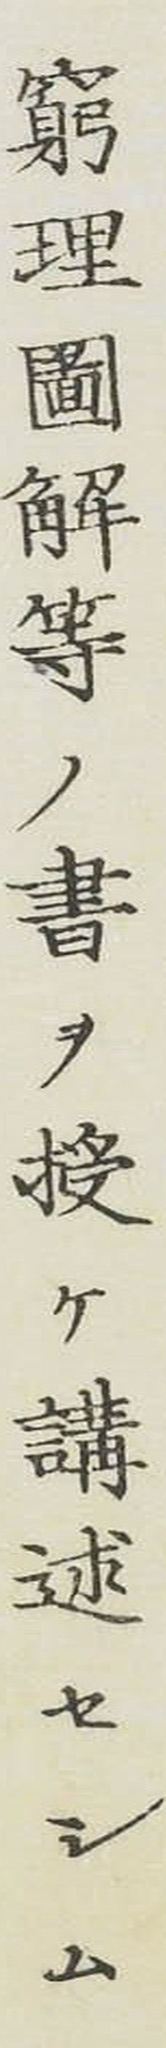窮理図解等ノ書ヲ授ケ講述セシム
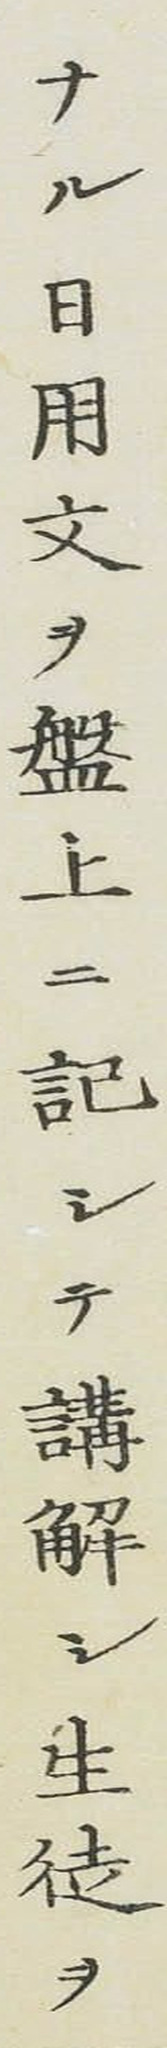ナル日用文ヲ盤上ニ記シテ講解シ生徒ヲ
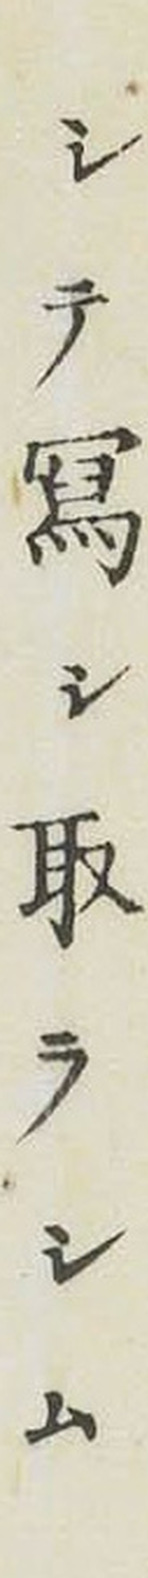シテ写シ取ラシム
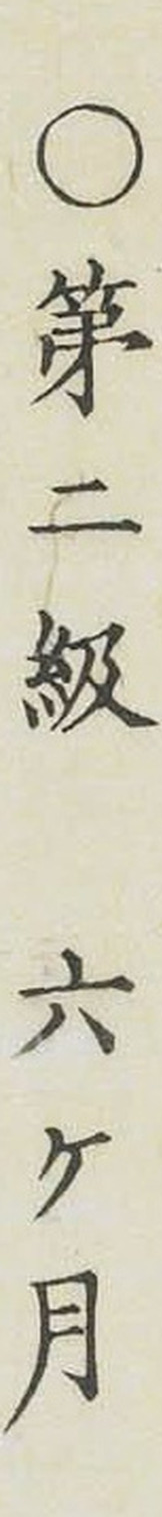○第二級六ケ月
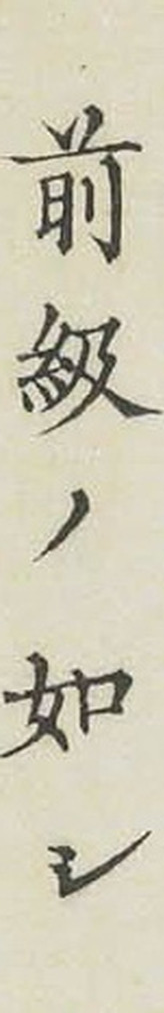前級ノ如シ
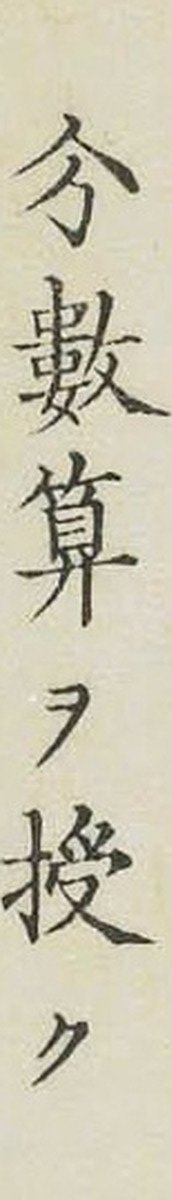分数算ヲ授ク
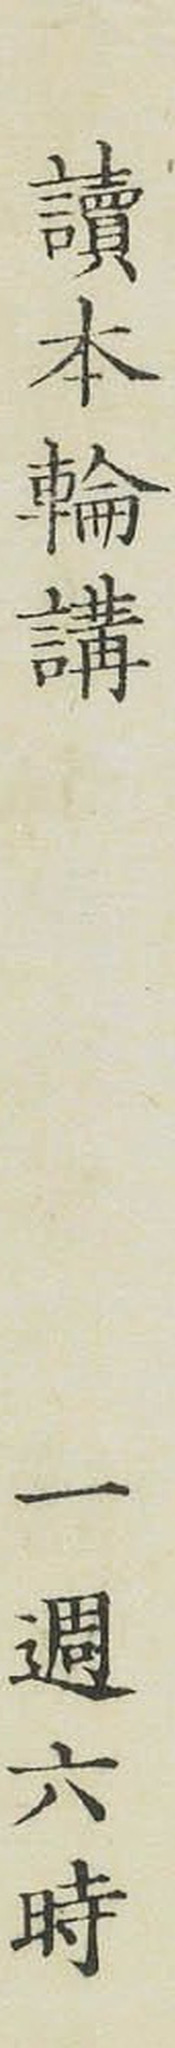読本輪講一週六時
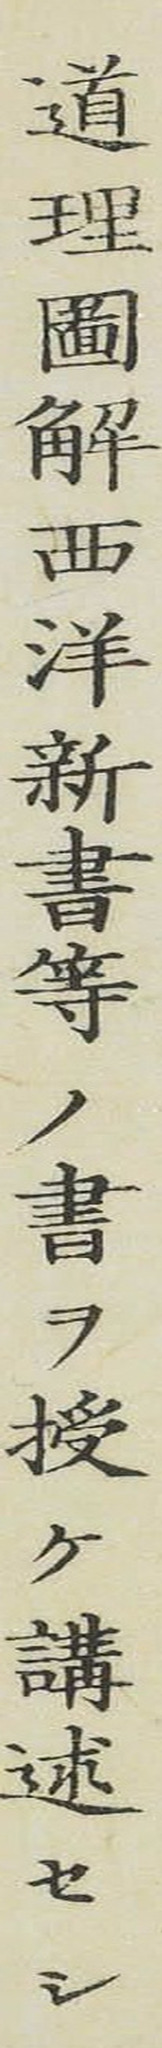道理図解西洋新書等ノ書ヲ授ケ講述セシ

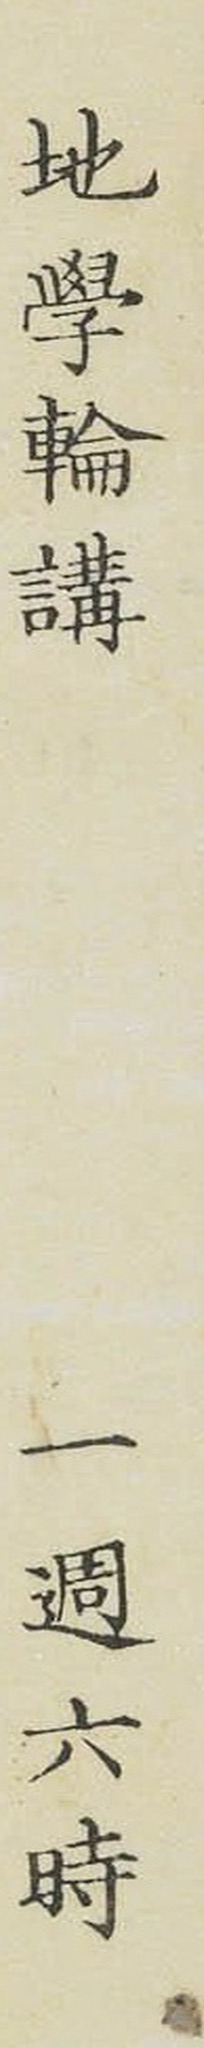地学輪講一週六時
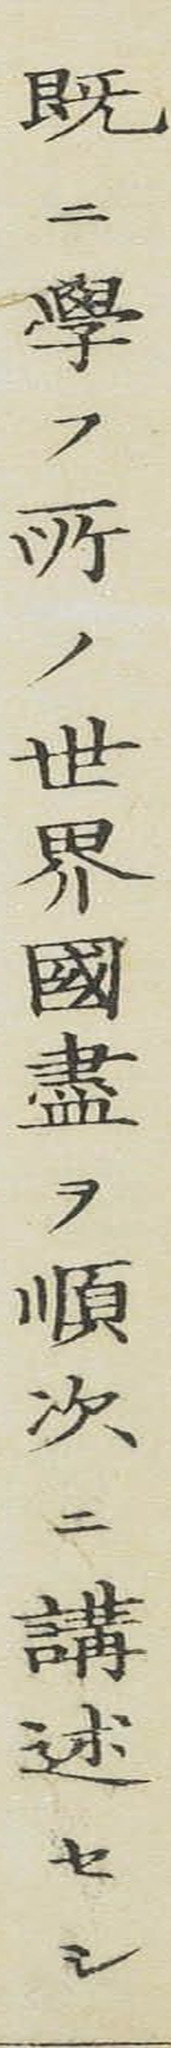既ニ学フ所ノ世界国盡ヲ順次ニ講述セシ
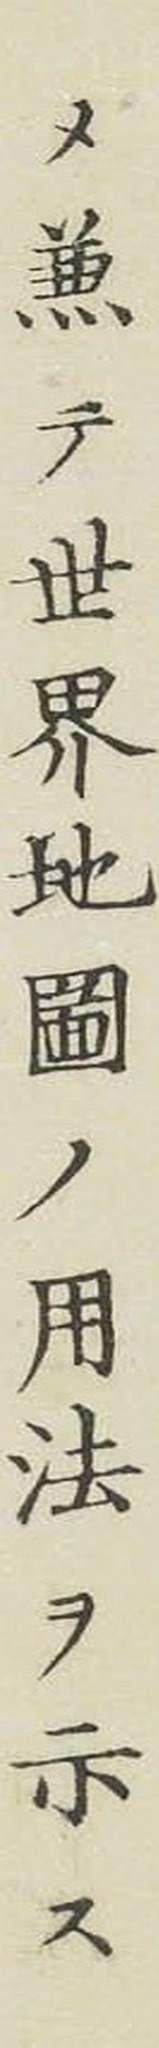メ兼テ世界地図ノ用法ヲ示ス
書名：小学教則
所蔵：東京学芸大学教育コンテンツアーカイブ
